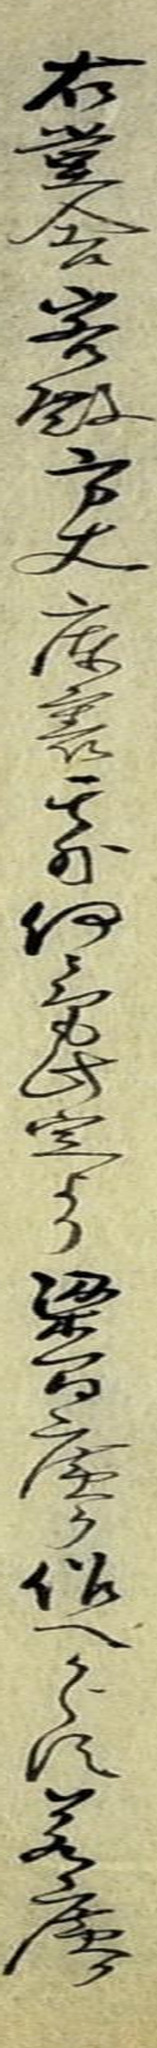右堂舎客殿方丈庫裏其外何に而も此定より梁間広く作へからす若広く
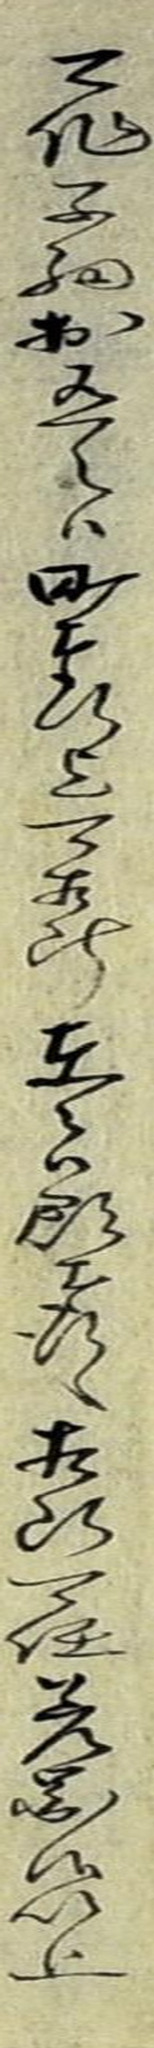可作子細於有之は町奉行迄可相断在々は郡奉行へ相断可任差図候以上
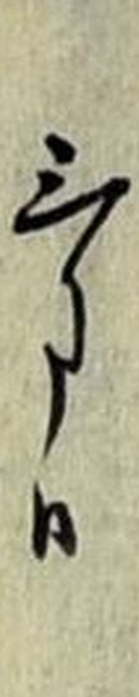三月日
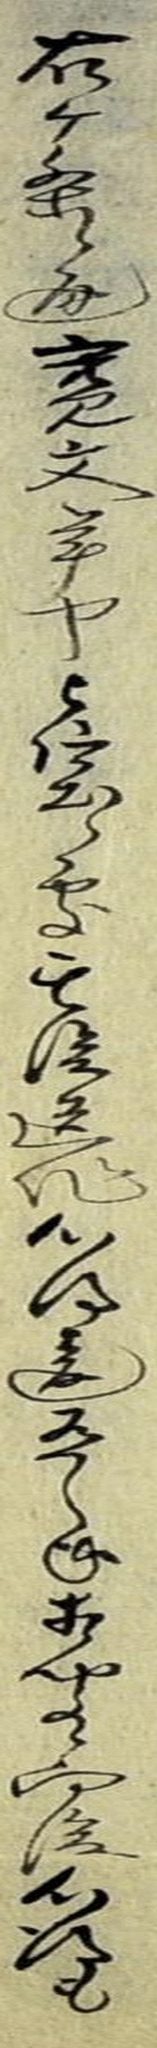右ケ条之通寛文年中被仰出候処其後造作心得違有之趣相聞候向後心得も
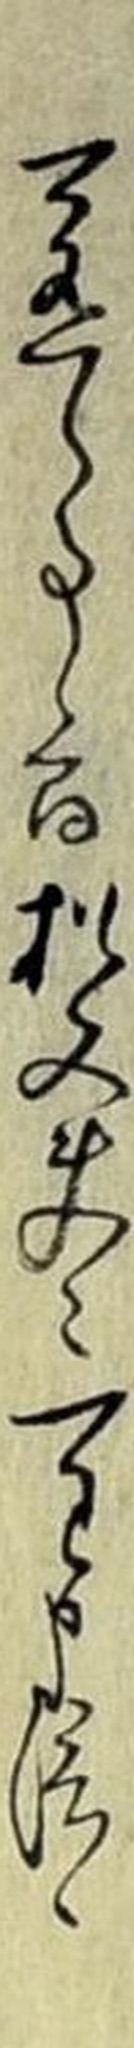可有之事候間猶又夫々可被申渡候
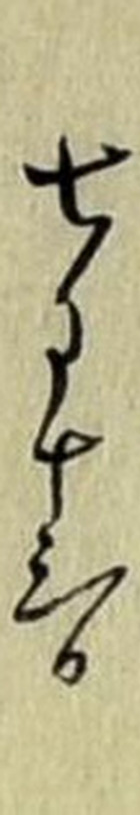七月十三日
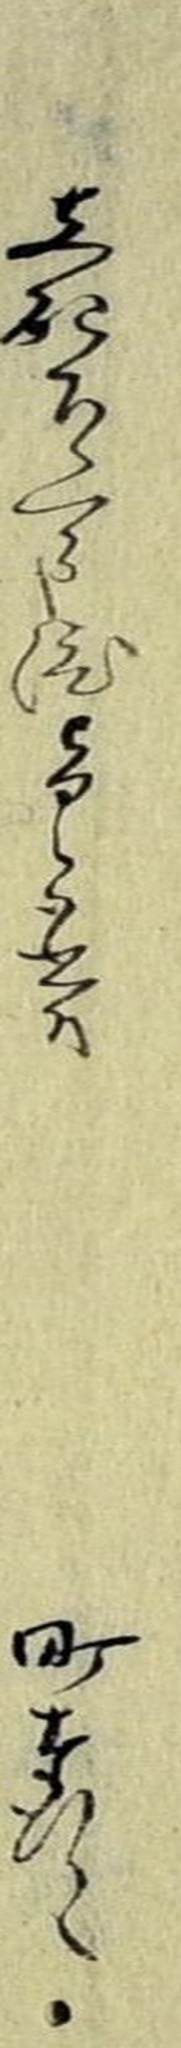支配下へ可申渡旨之御書付町奉行へ
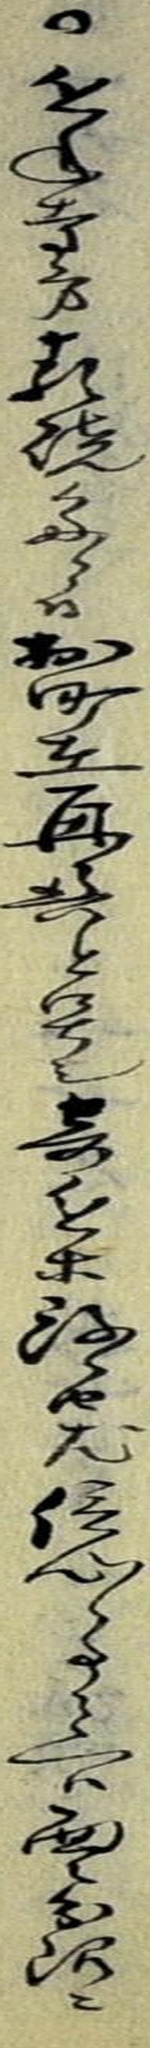〇近年寺方類焼多候に付於町在再興と号し寄進等致候由尤信心之事に候へは面々分限に
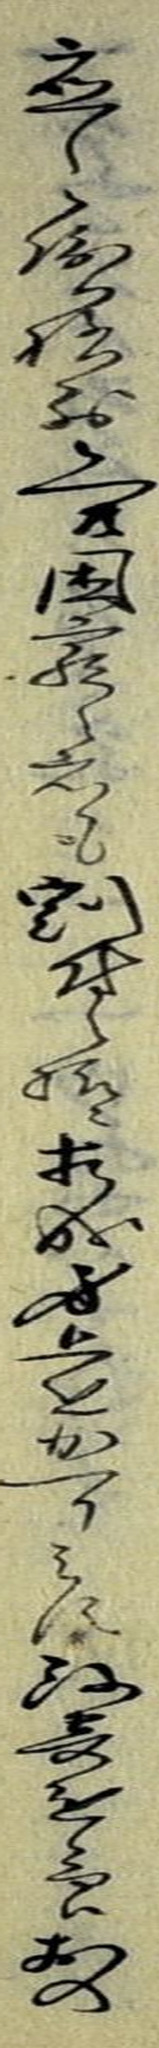応し候儀は格別候へ共困窮之者へも割付候様に相成身上をかへりみす致寄進候而はおの
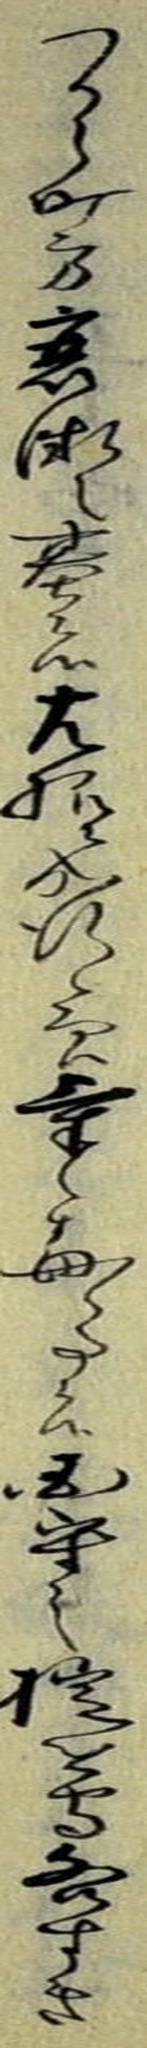つから町方衰微之基に候左様に成行候而は気之毒事に候国守之掟を守各すき
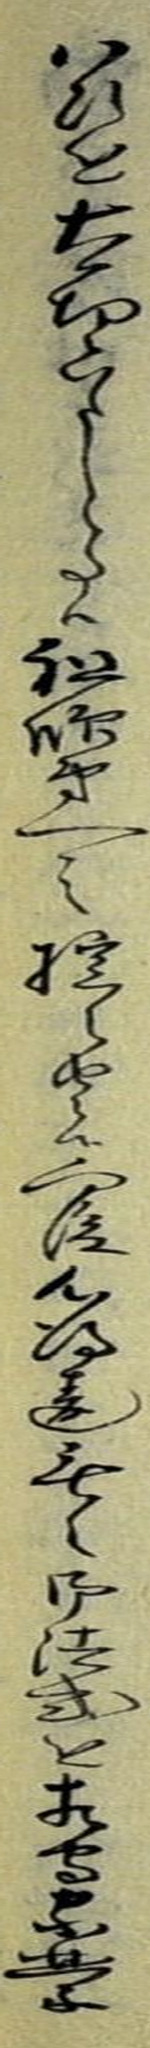はひを太切にいたし候事は祖師第一之掟之由に候向後心得違無之御法式を相守家業
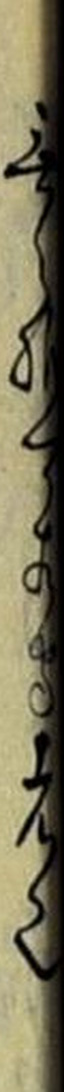無之様可相守者也
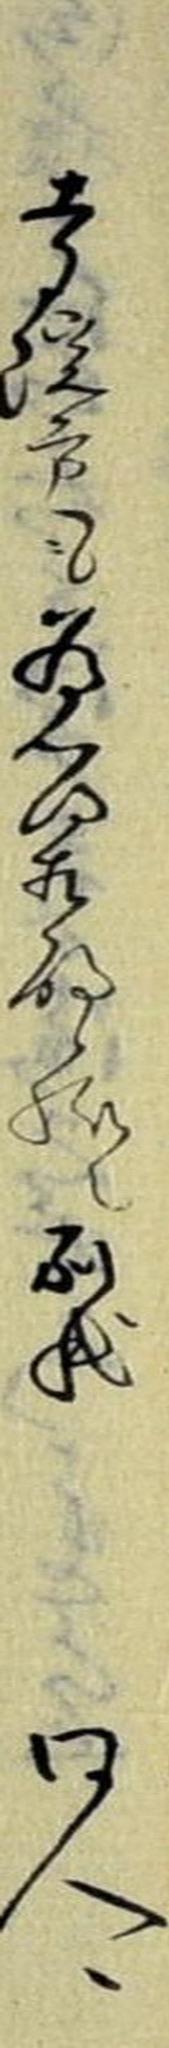寺院方へも為心得相触候様之別紙同人へ
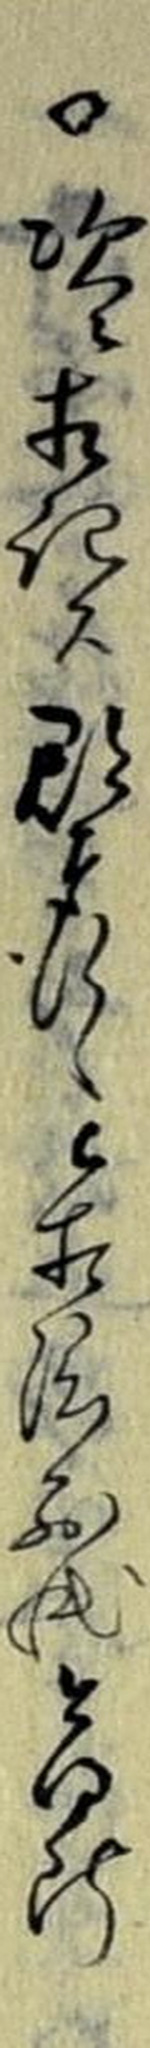〇次に相記す郡奉行へ被相渡別紙と同断
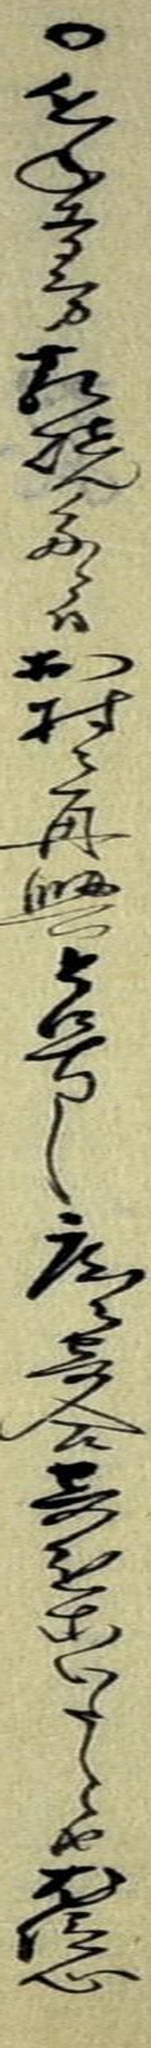〇近年寺方類焼多候に付於村々再興と号し度々寄合寄進等いたし候由尤信心
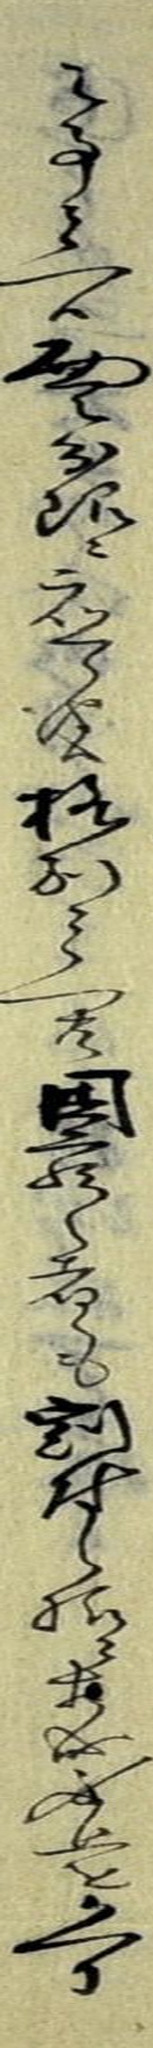之事に候へは面々分限に応候儀は格別に候へ共困窮之者へも割付候様に相成身上かへり
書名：命令之部 二
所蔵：福井県文書館 Fukui Prefectural Archives
